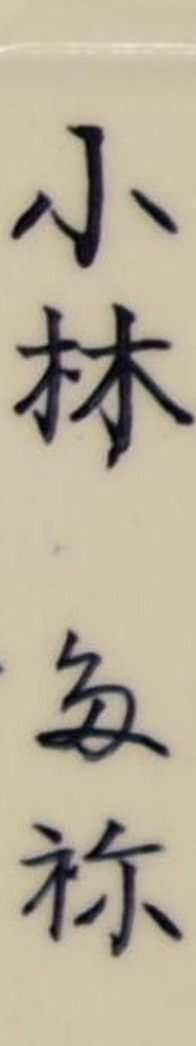小林多祢
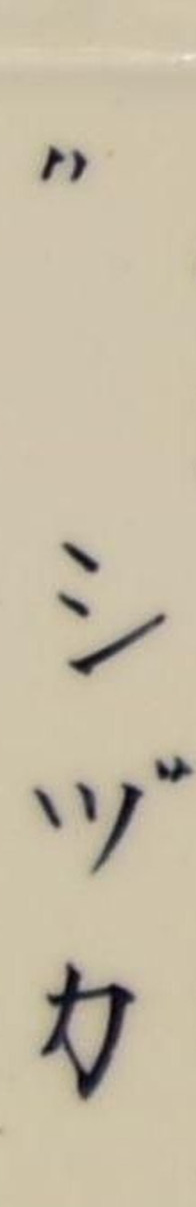シヅカ
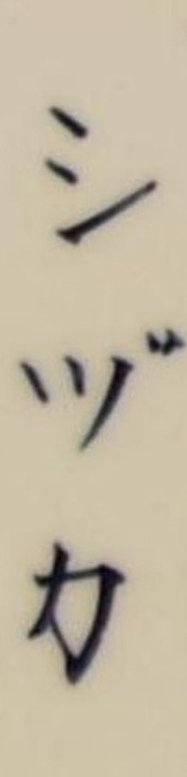シヅカ
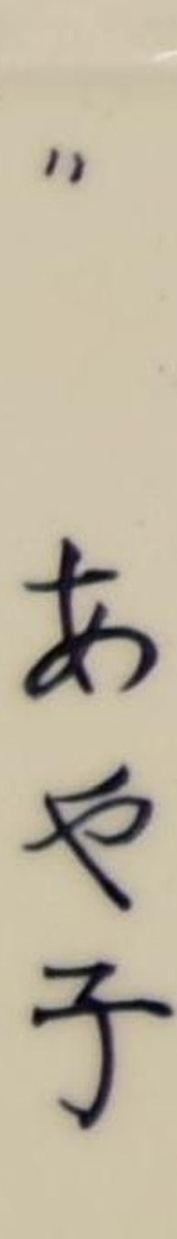あや子
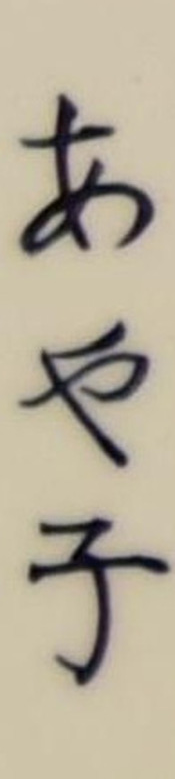あや子
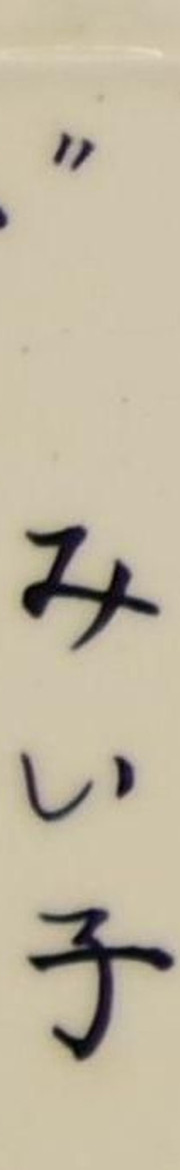みい子
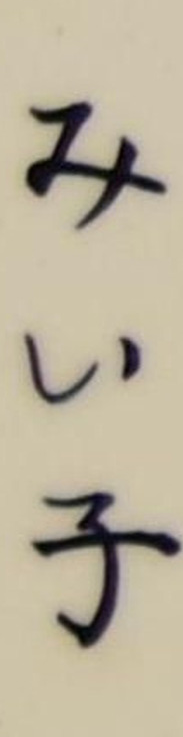みい子
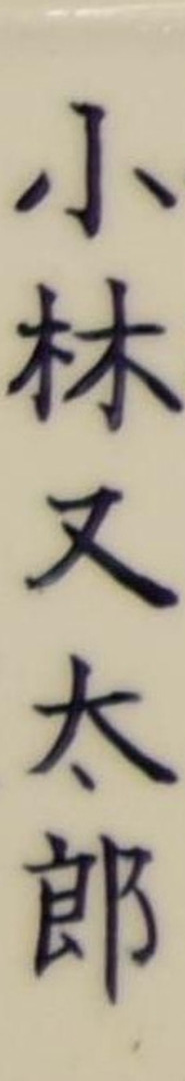小林又太郎
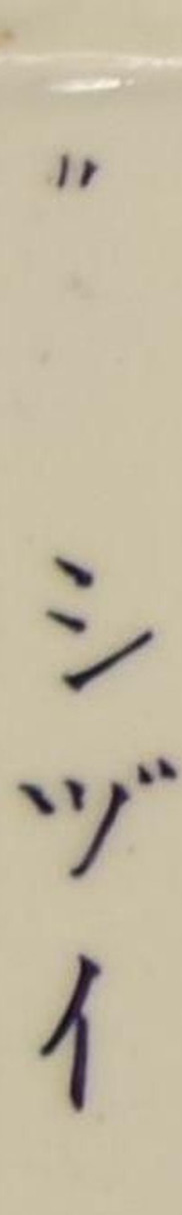シヅイ
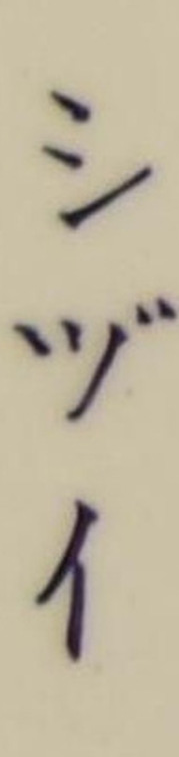シヅイ

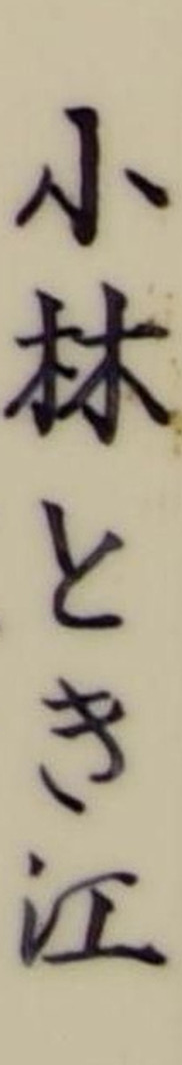小林とき江
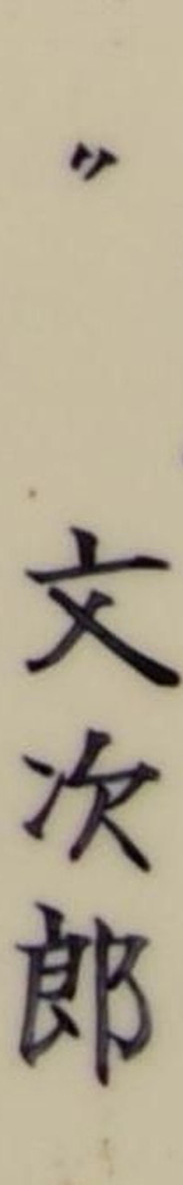文次郎
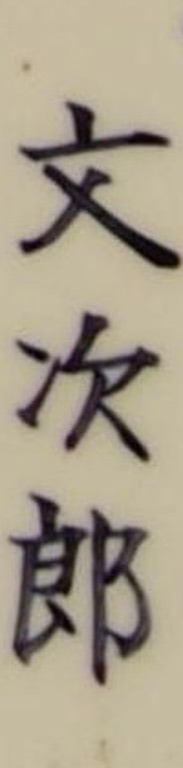文次郎
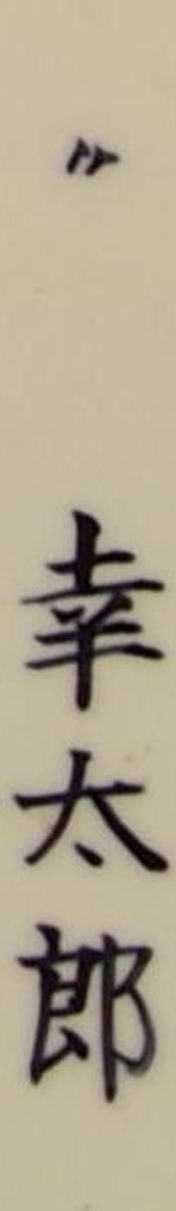幸太郎
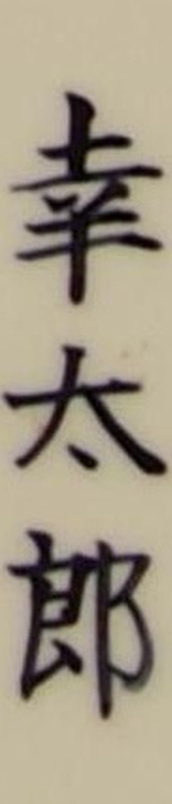幸太郎
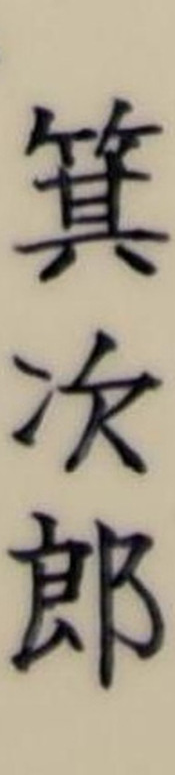箕次郎
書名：A~D
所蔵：koyasan kongobuji
